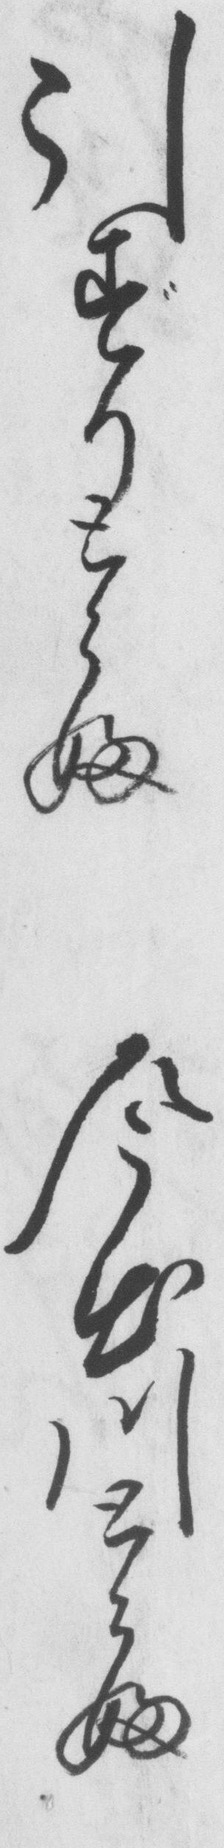引ずりとうふ今出川とうふ

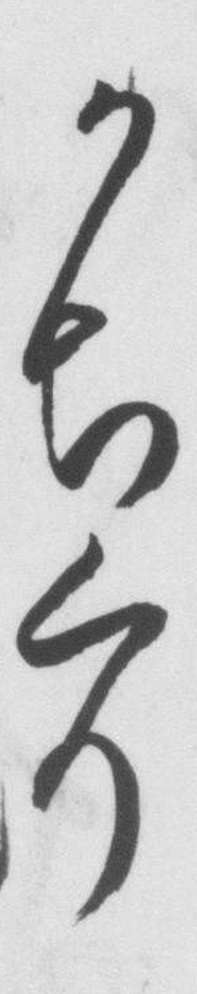かちくり
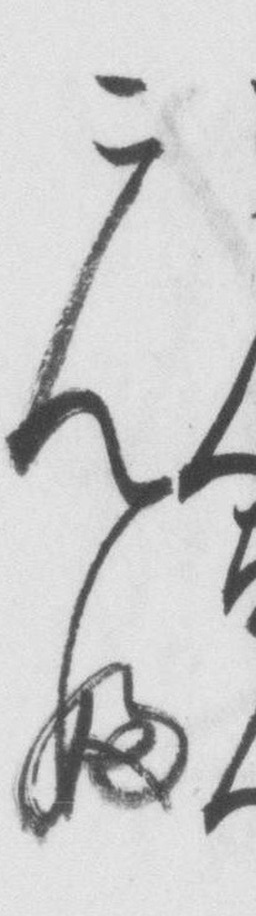こんふ
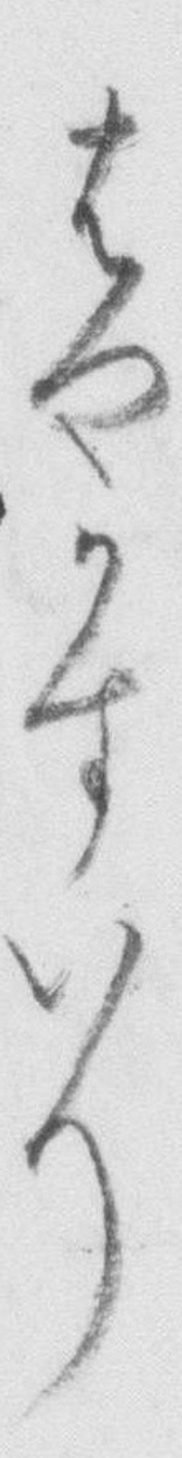はやうすいり
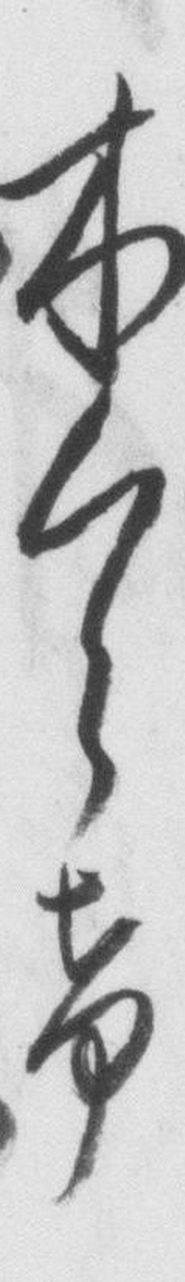木くらけ
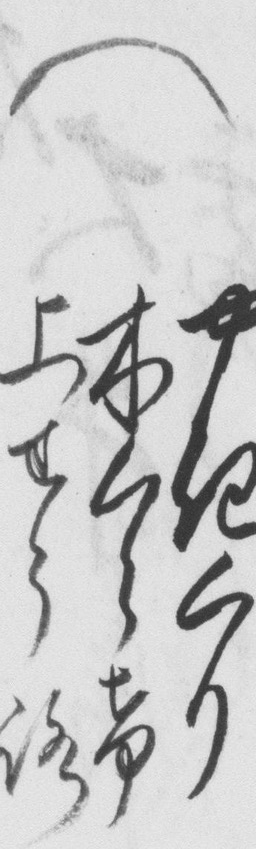木くらけ
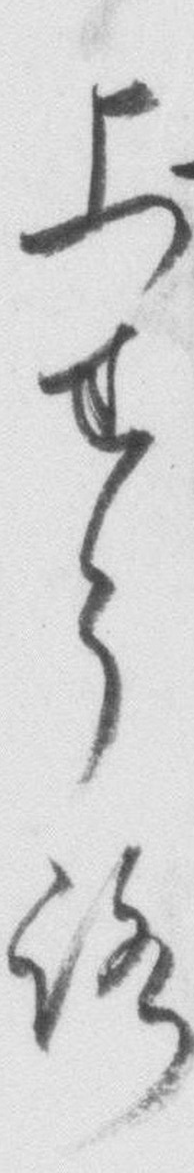上せうろ

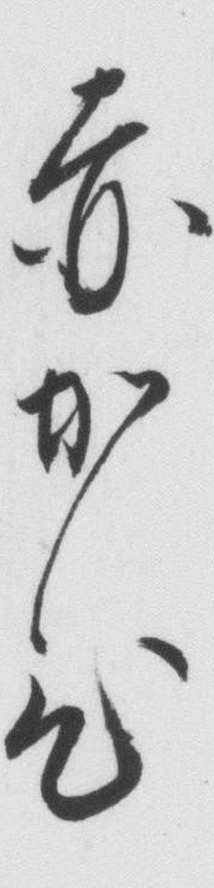赤かい
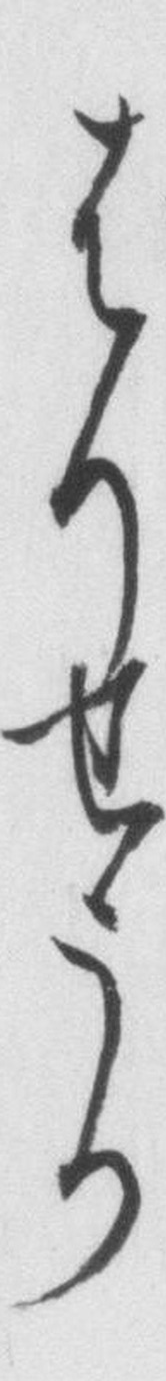はりせうか
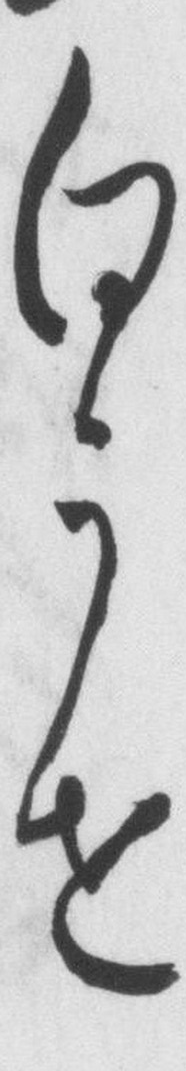白うを
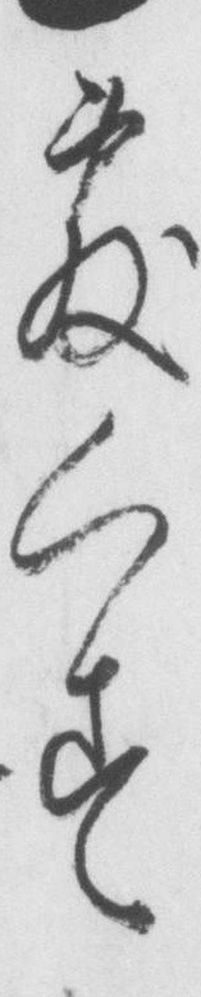敷くず
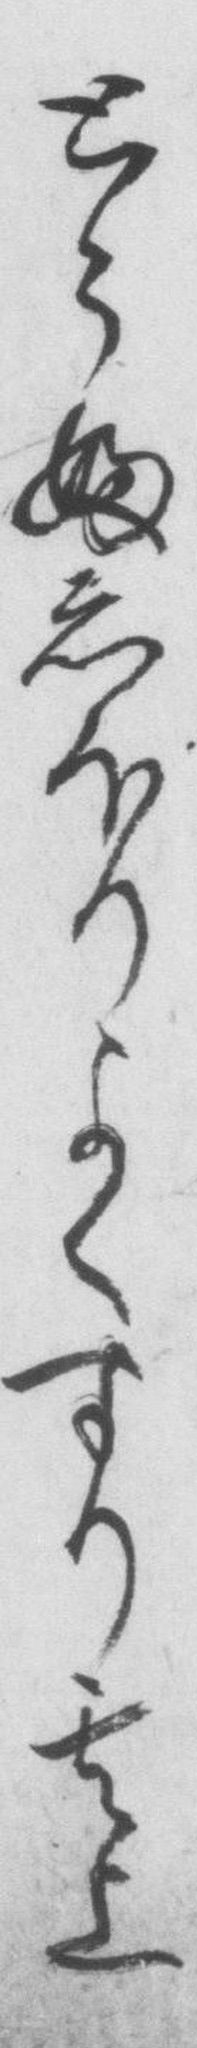とうふしぼりよくすり其上
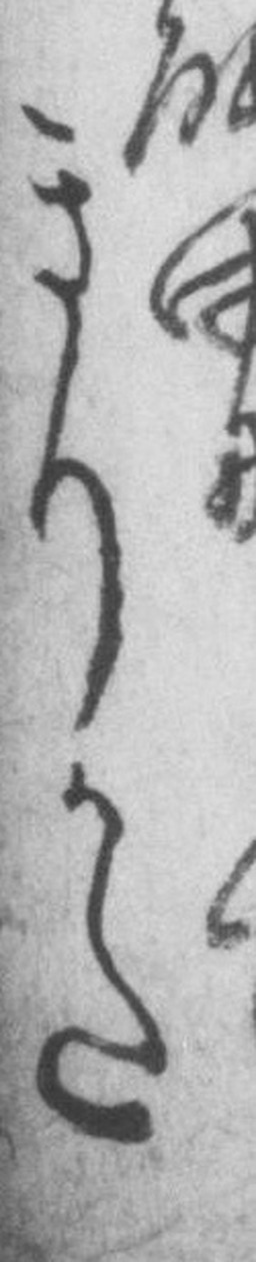きりかた

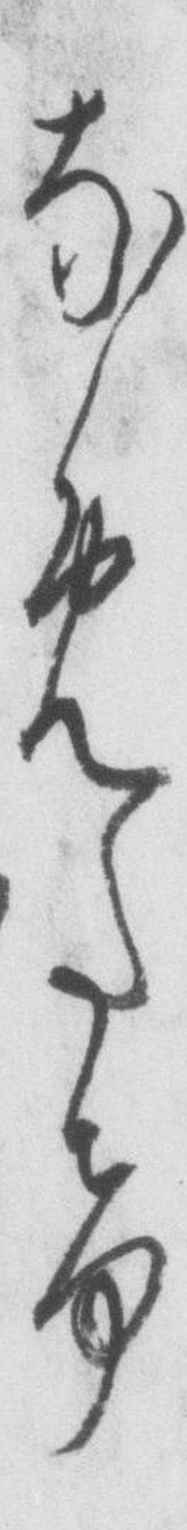なめたけ
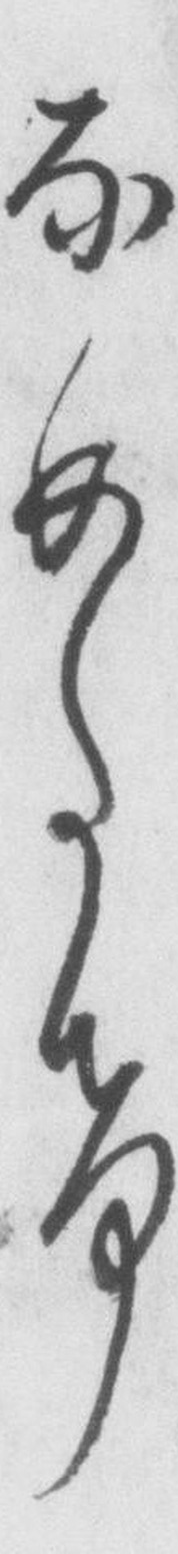なめたけ

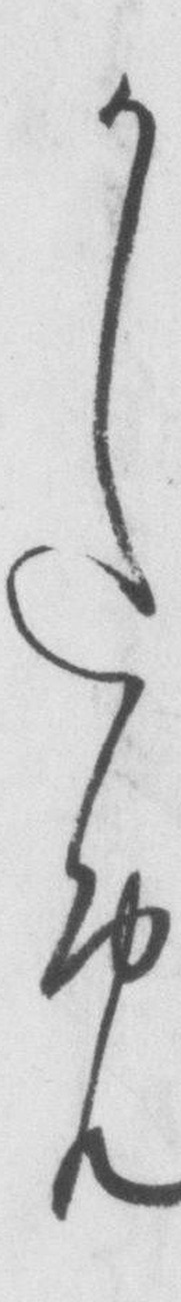かため
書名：料理筌
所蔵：大阪府立大学学術情報センター 国文学研究資料館
